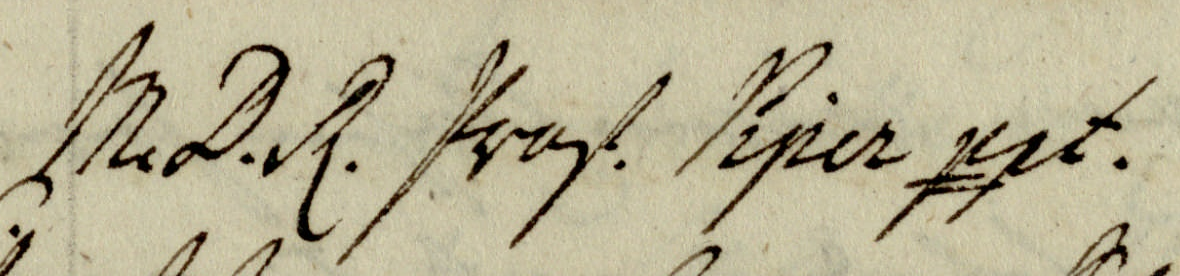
M. D. R. Prof. Piper ppt.
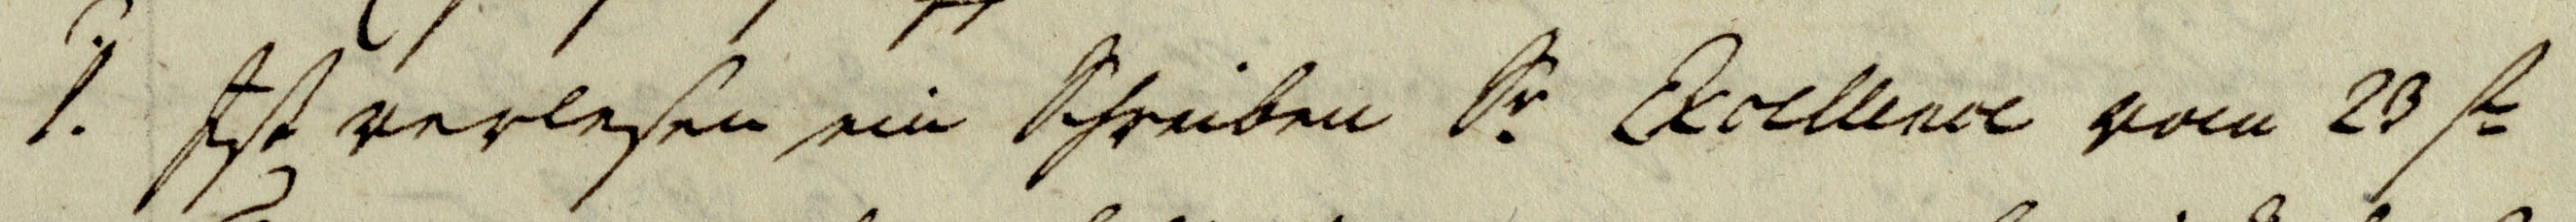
1. Ist verlesen ein Schreiben Sr Excellence vom 23 sten
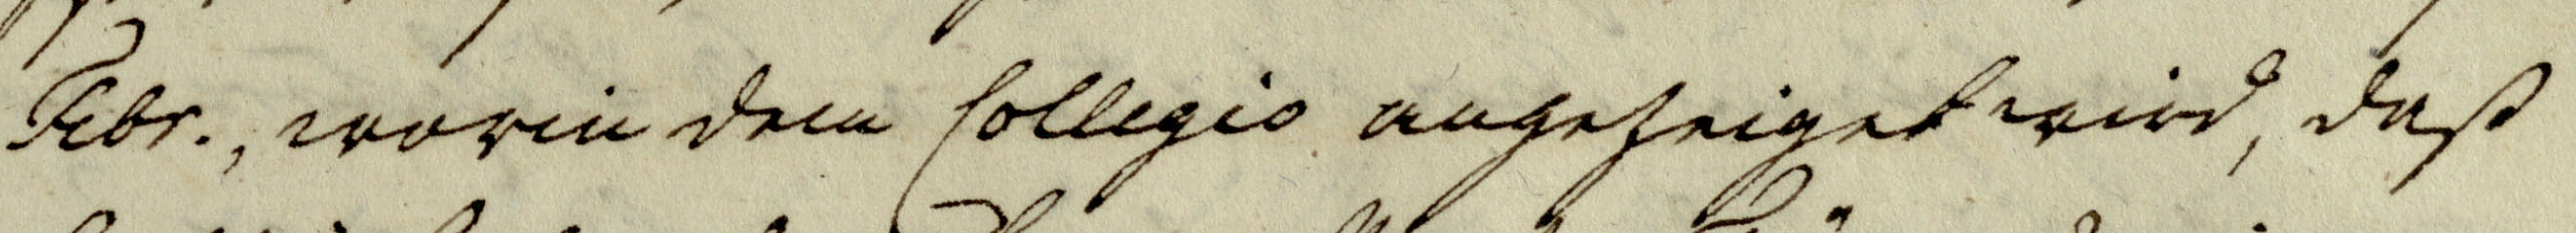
Febr., worin dem Collegio angezeiget wird, daß
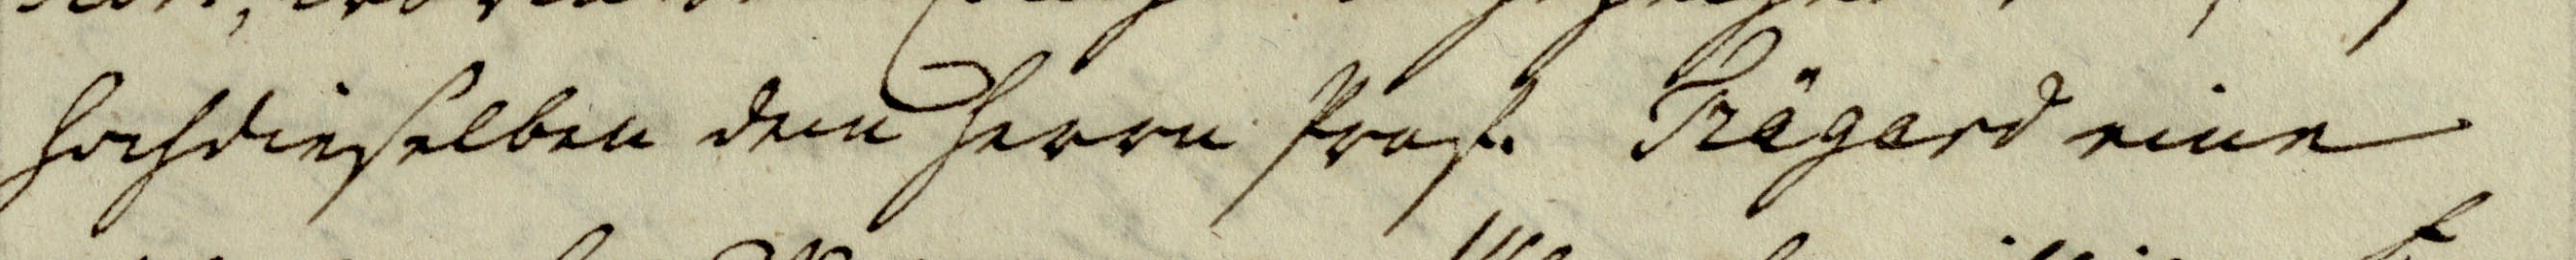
hochdieselben dem Herrn Prof. Trägard eine
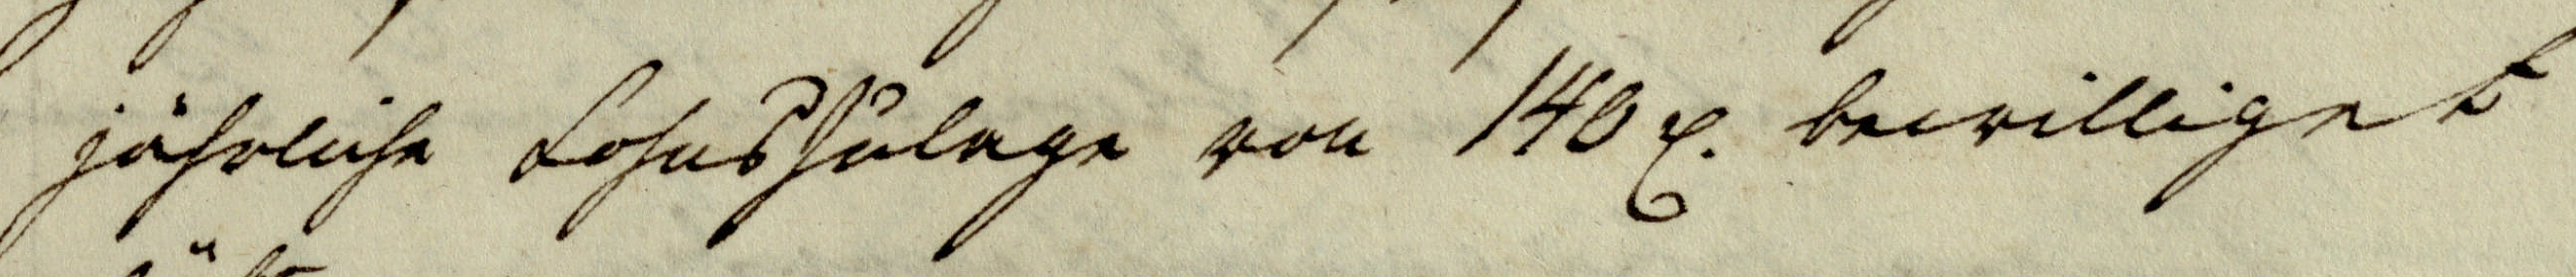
jährliche Lohns Zulage von 140 l. bewilliget
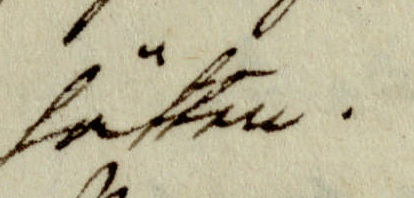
hätten.
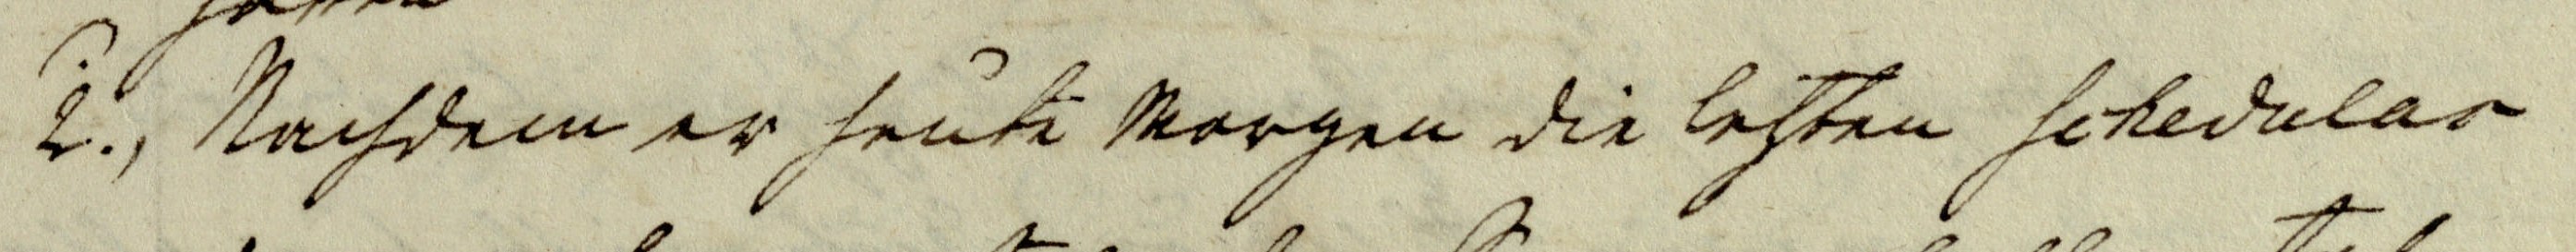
2., Nachdem er heute Morgen die letzten Schedulas
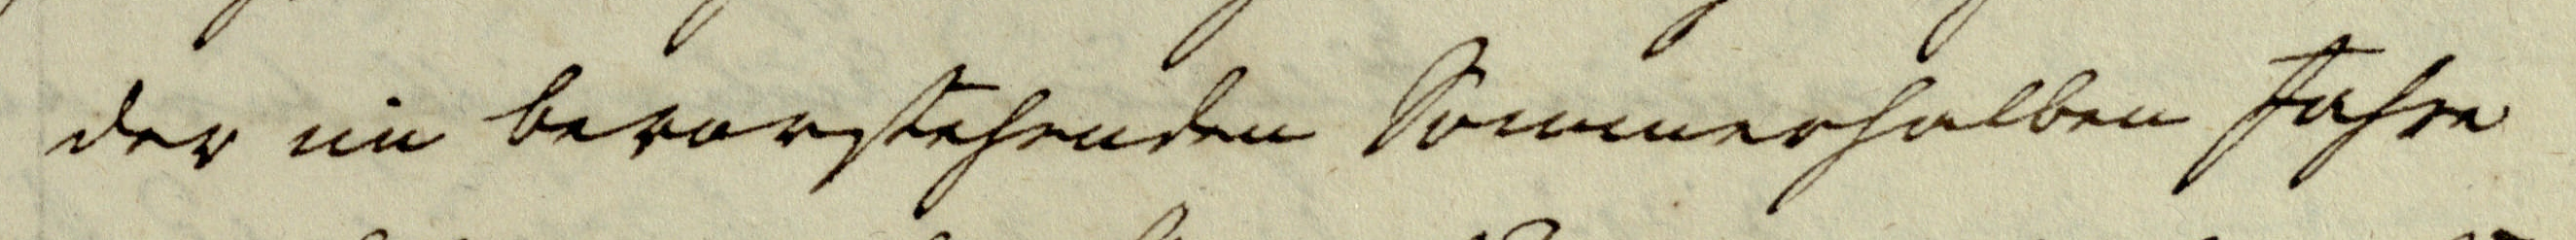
der im bevorstehenden Sommerhalben Jahre
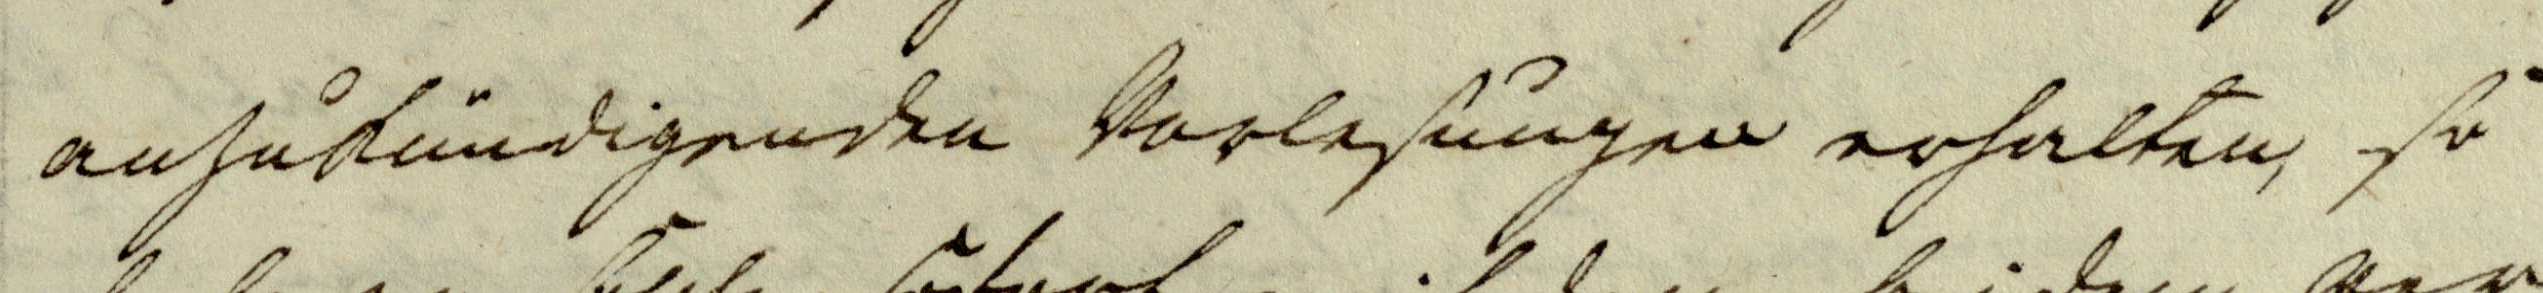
anzukündigenden Vorlesungen erhalten, so
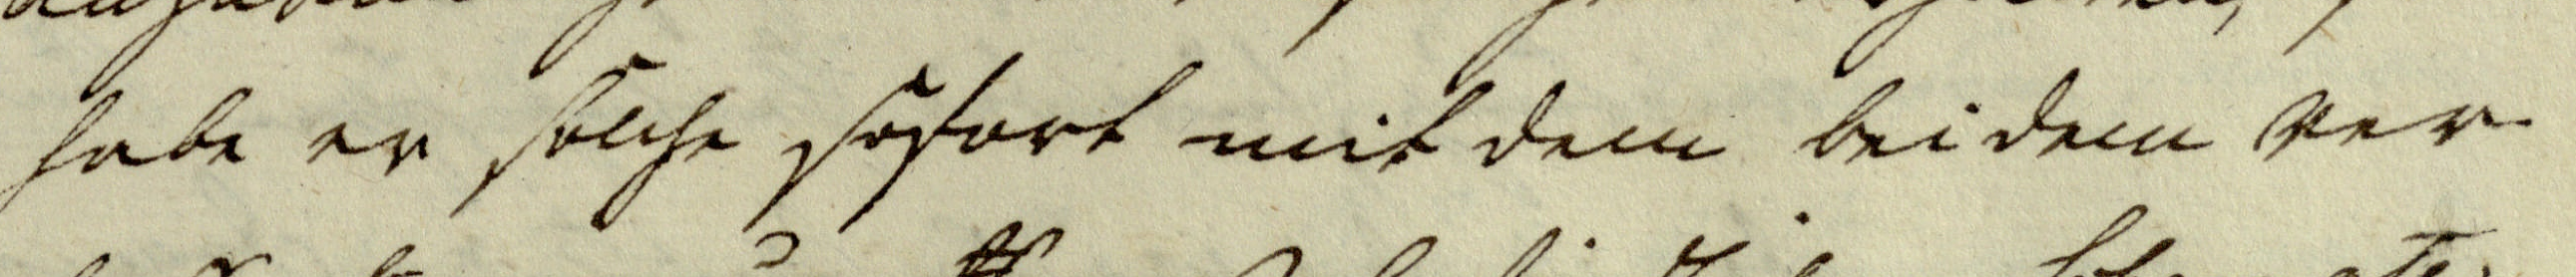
habe er solche sofort mit dem bei dem ver¬
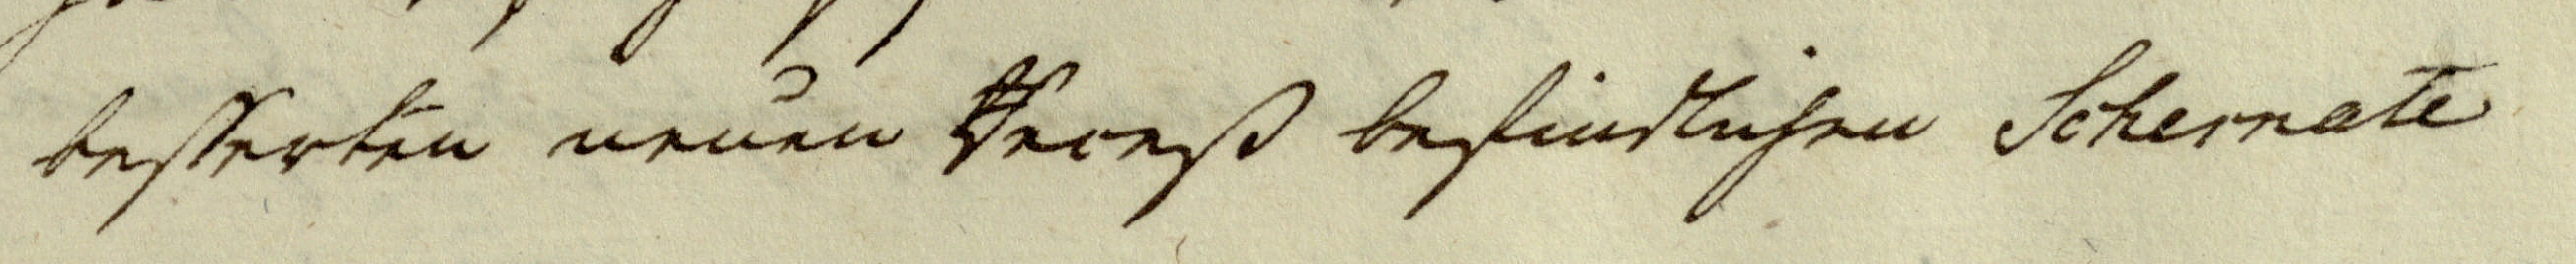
besserten neuen Receß befindlichen Schemate
